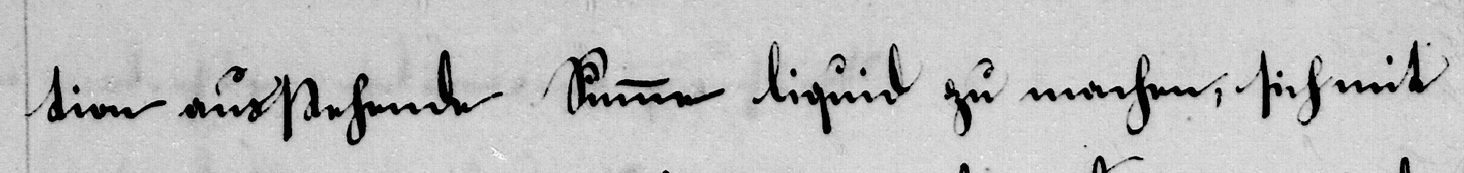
tion ausstehende Summe liquid zu machen, sich mit
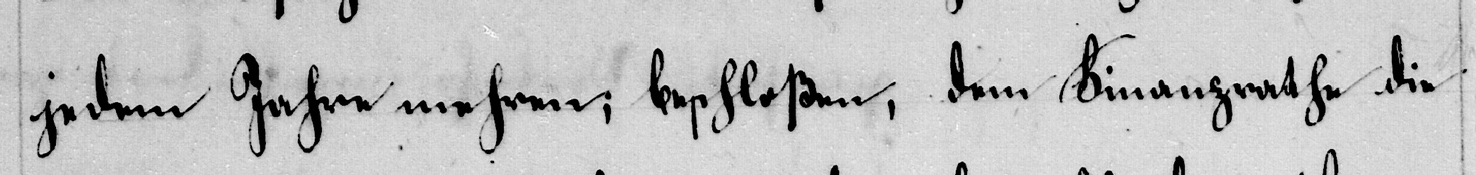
jedem Jahre mehren; beschloßen, dem Finanzrathe die
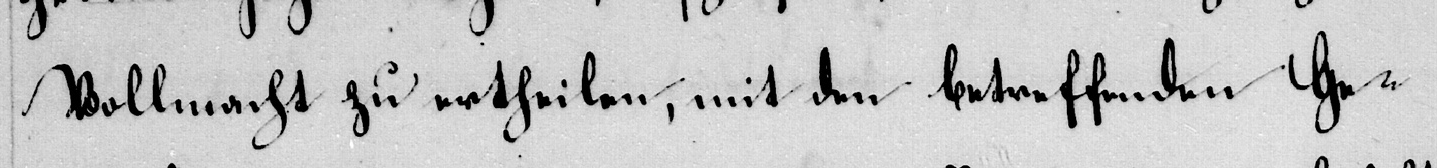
Vollmacht zu ertheilen, mit den betreffenden Ge¬
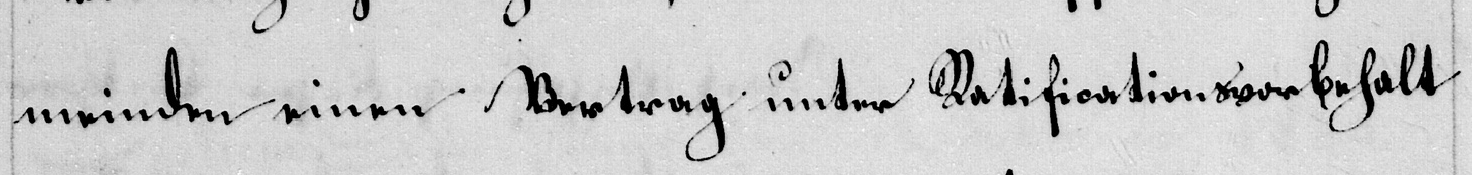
meinden einen Vertrag unter Ratificationsvorbehalt
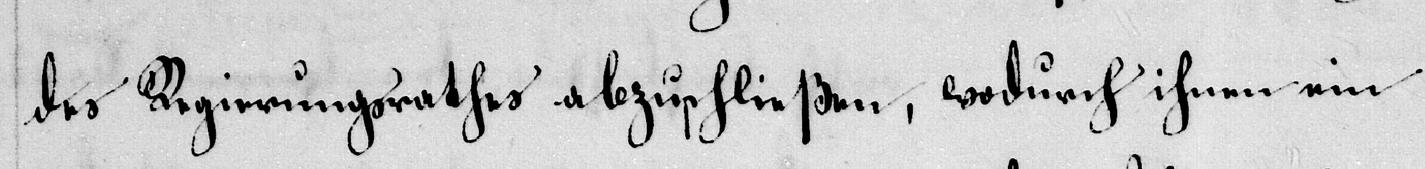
des Regierungsrathes abzuschließen, wodurch ihnen ein
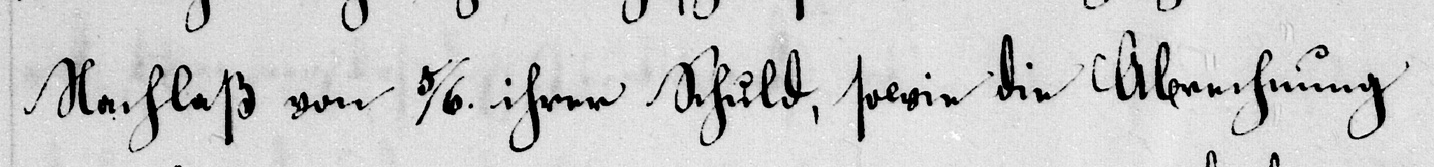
Nachlaß von 5/6. ihrer Schuld, sowie die Abrechnung
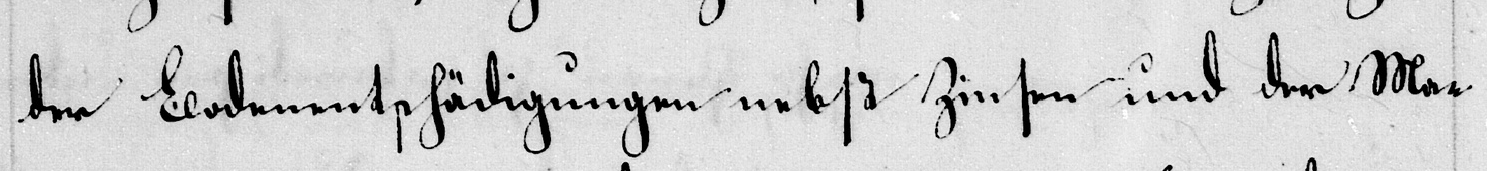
der Bodenentschädigungen nebst Zinsen und der Ma¬
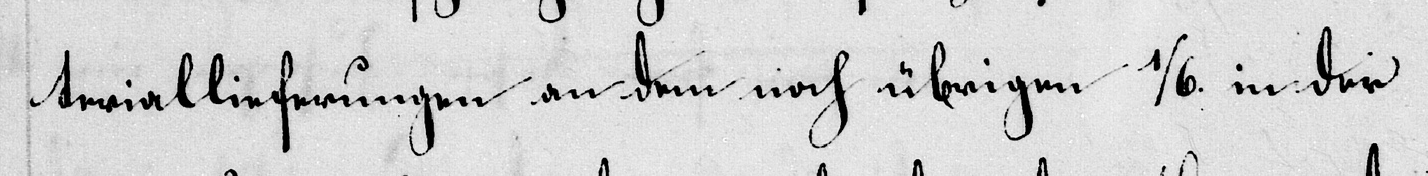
teriallieferungen an dem noch übrigen 1/6. in der
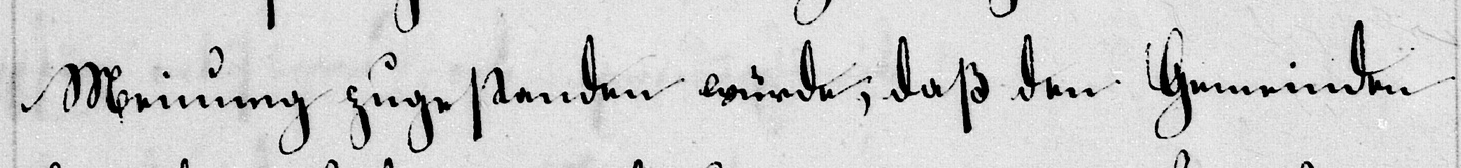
Meinung zugestanden würde, daß den Gemeinden
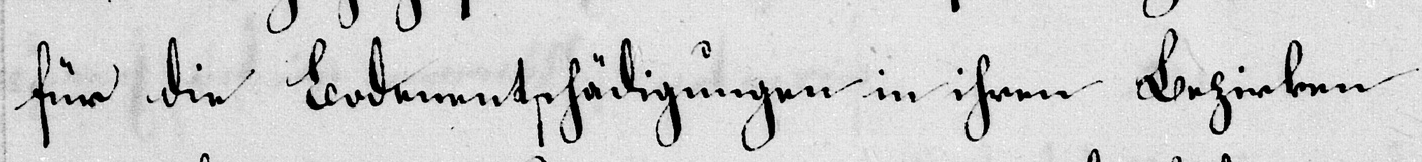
für die Bodenentschädigungen in ihren Bezirken
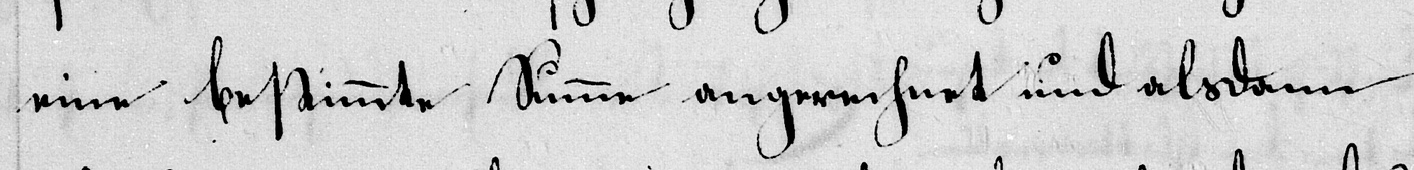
eine bestimmte Summe angerechnet und alsdann
